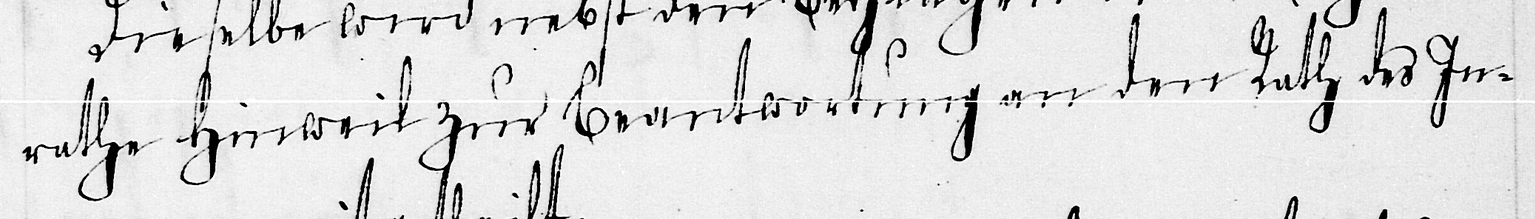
rathe Hinweil zur Beantwortung an den Rath des In¬
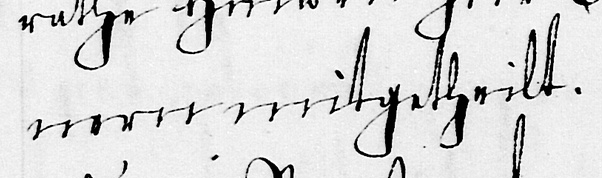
nern mitgetheilt.
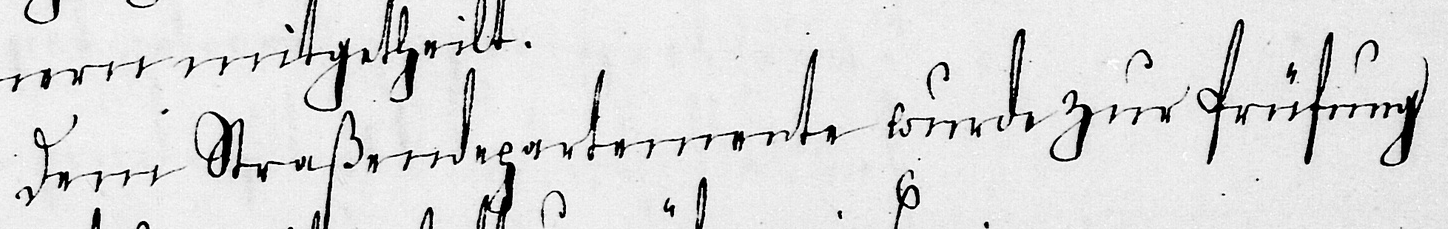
Dem Straßendepartemente wurde zur Prüfung
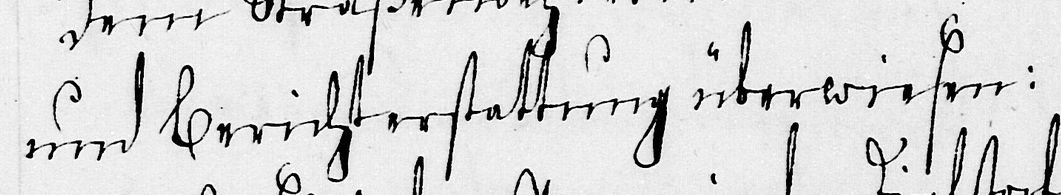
und Berichterstattung überwiesen:
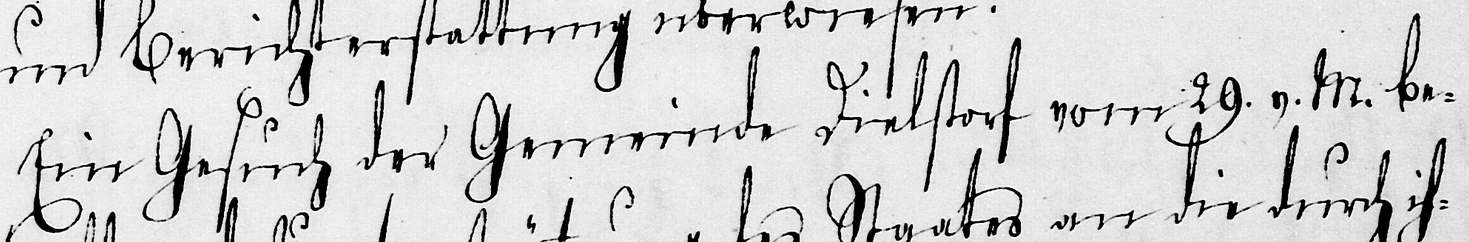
Ein Gesuch der Gemeinde Dielstorf vom 29. v. M. b¬
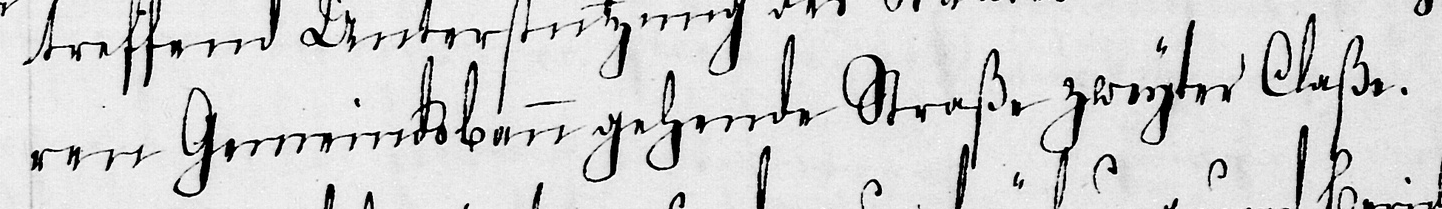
hren Gemeindsbann gehende Straße zweyter Claße.
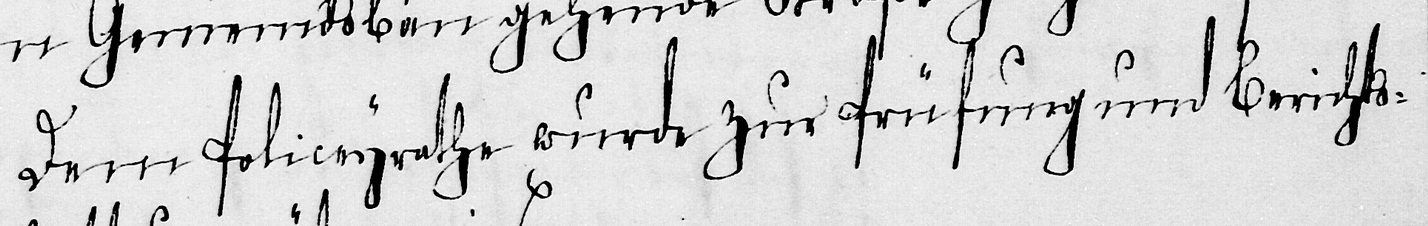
Dem Policeyrathe wurde zur Prüfung und Berichts¬
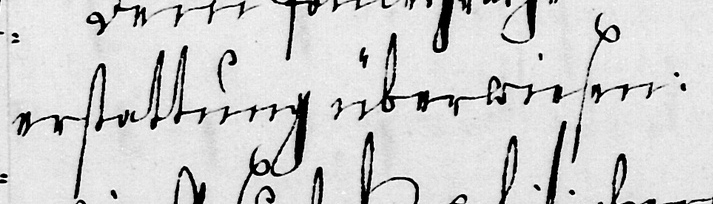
erstattung überwiesen:
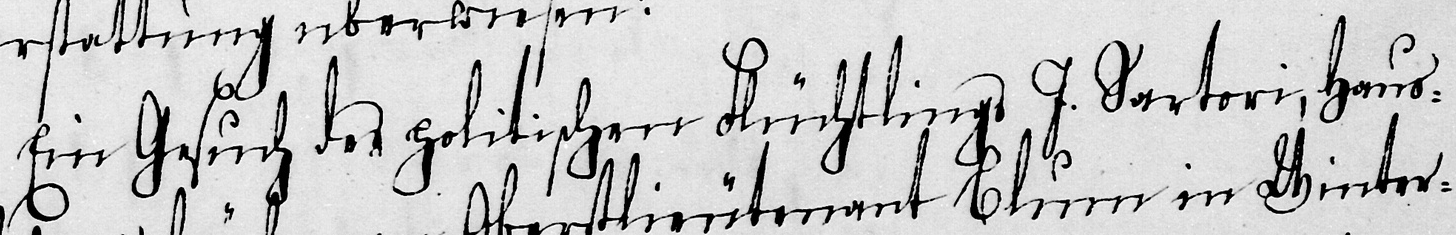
Ein Gesuch des politischen Flüchtlings J. Sartori, Haus¬
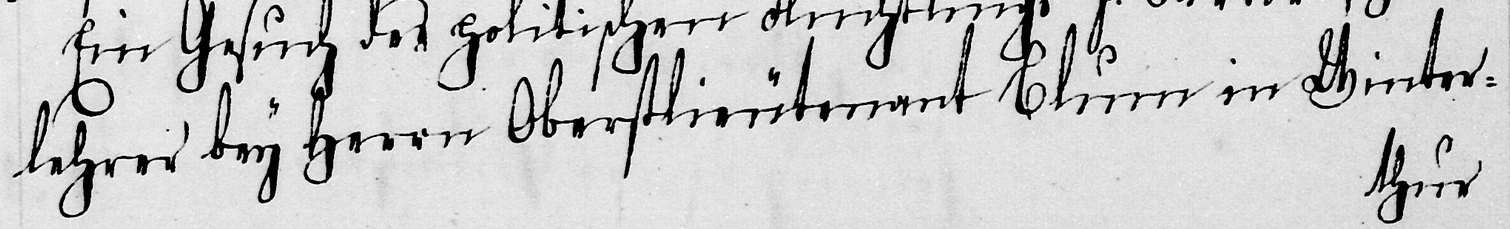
lehrer bey Herrn Oberstlieutenant Blum in Winter-
